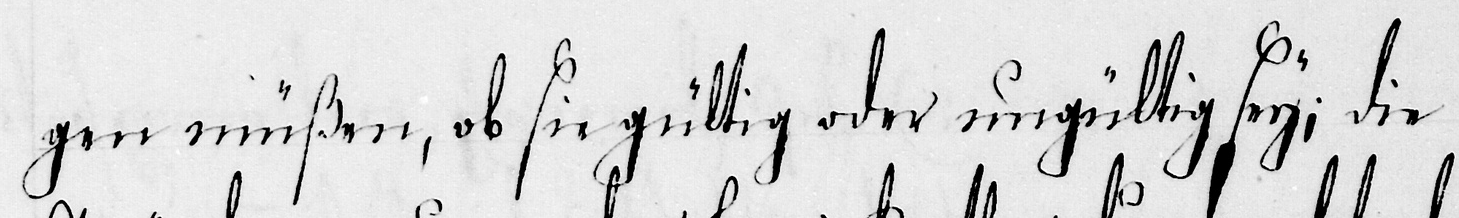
gen müßen, ob sie gültig oder ungültig sey; die
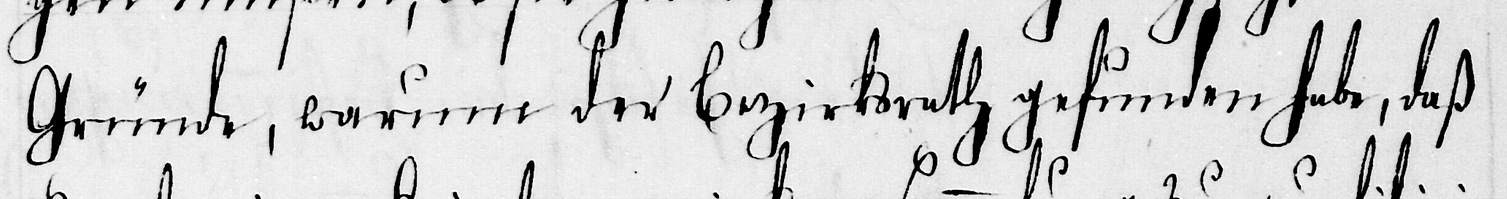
Gründe, warum der Bezirksrath gefunden habe, daß
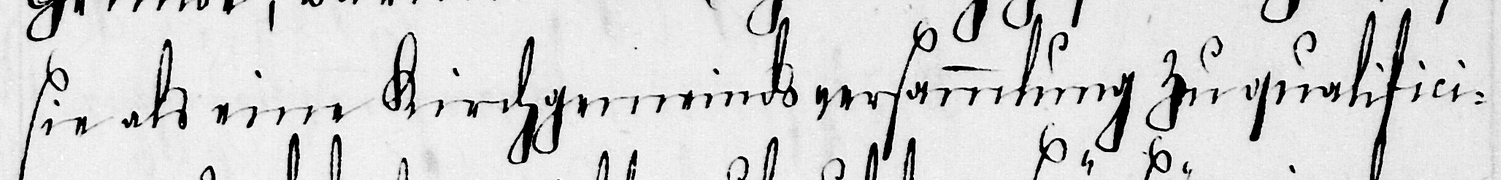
sie als eine Kirchgemeindsversammlung zu qualifici¬
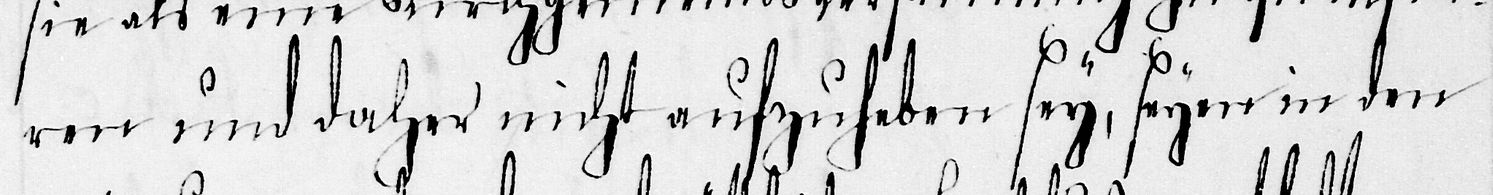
ren und daher nicht aufzuheben sey, seyen in den
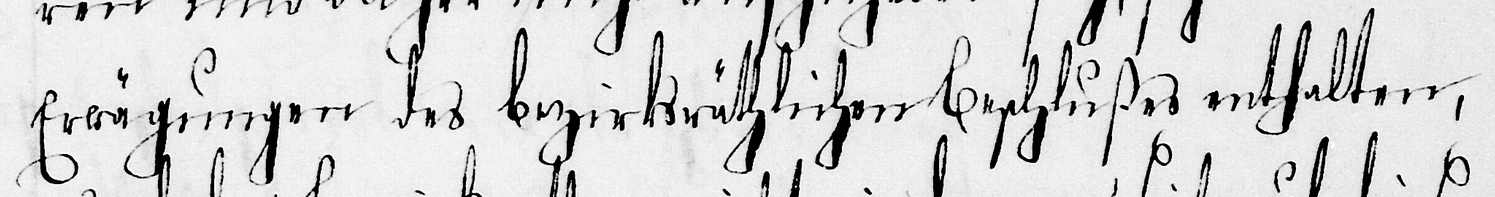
Erwägungen des bezirksräthlichen Beschlußes enthalten,
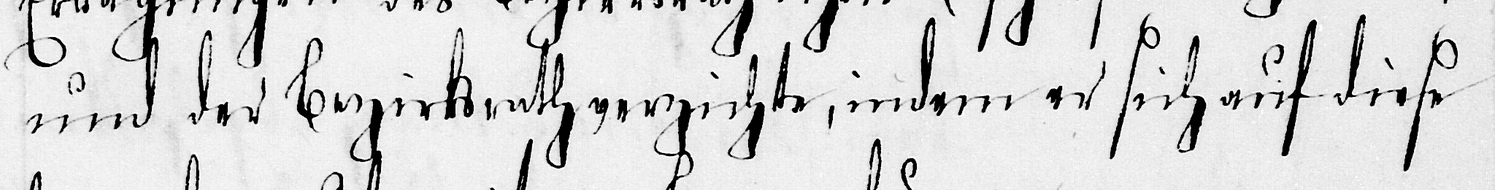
und der Bezirksrath verzichte, indem er sich auf dieses
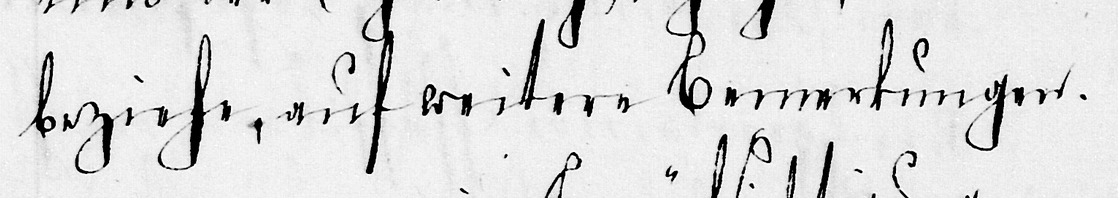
beziehe, auf weitere Bemerkungen.
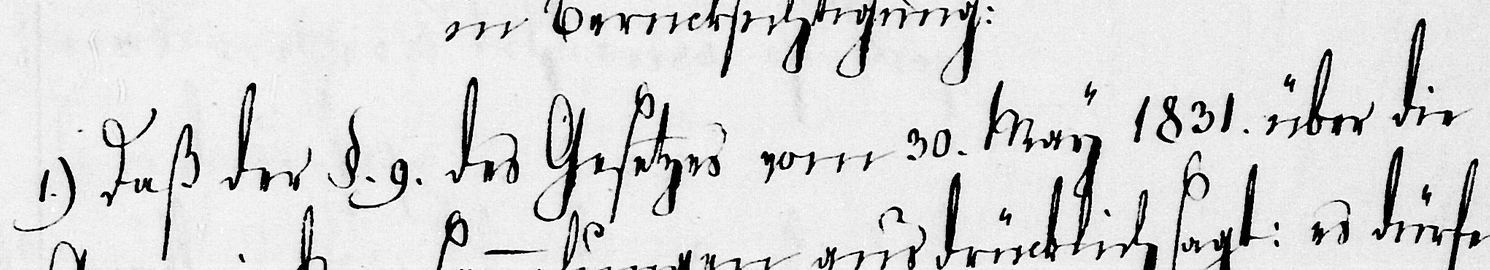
1.) Daß der §. 9. des Gesetzes vom 30. May 1831. über die
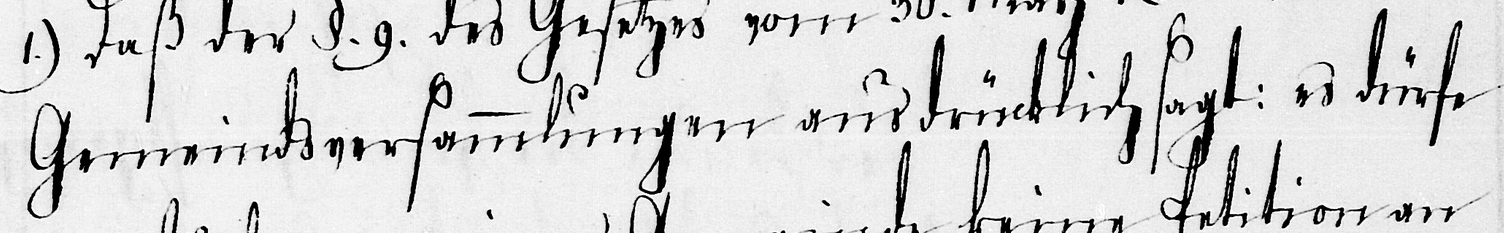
Gemeindsversammlungen ausdrücklich sagt: es dürfe
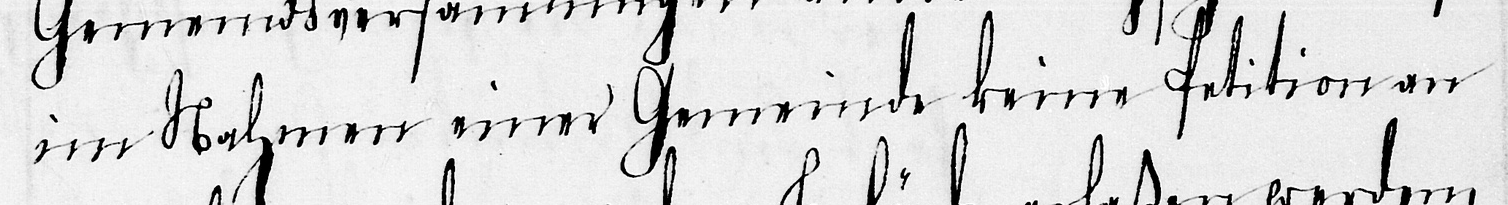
im Nahmen einer Gemeinde keine Petition an
